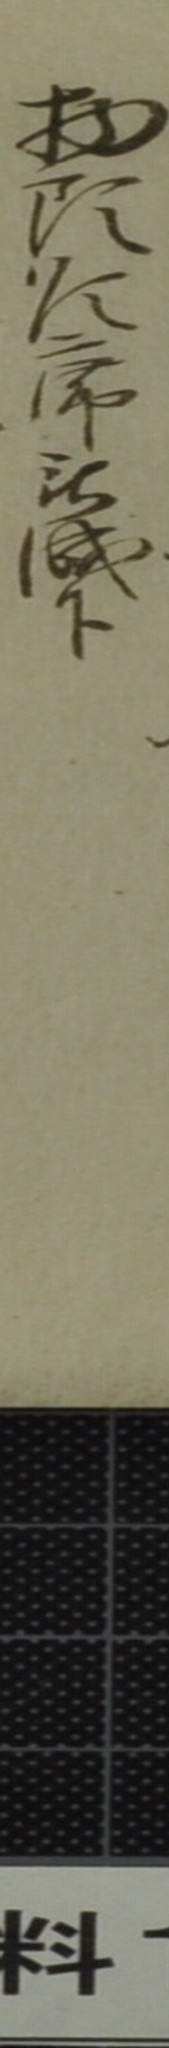物頭次席被成下
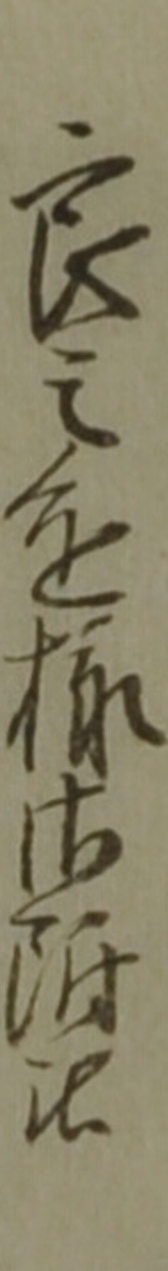良之進様御附被
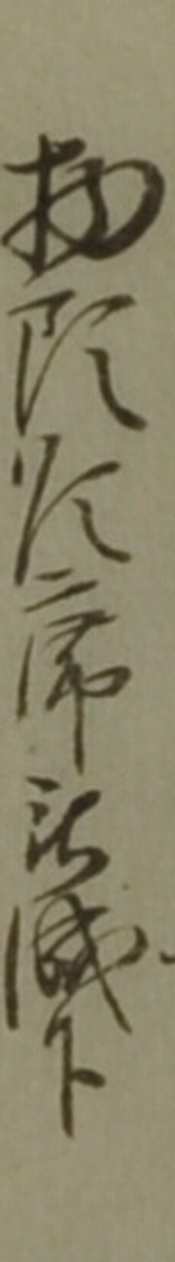物頭次席被成下
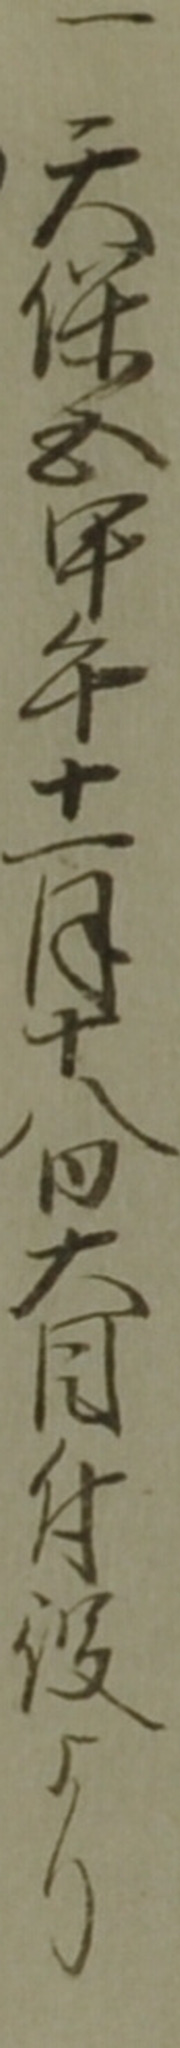一天保五甲午十一月十八日大目付役より
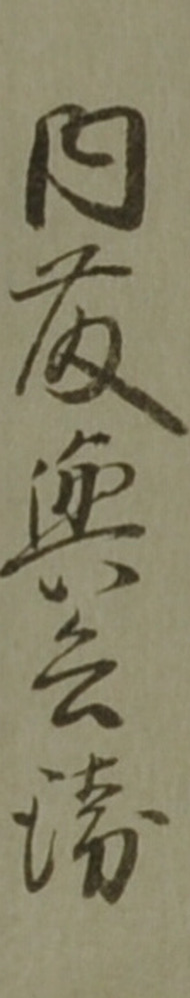内藤與兵衛
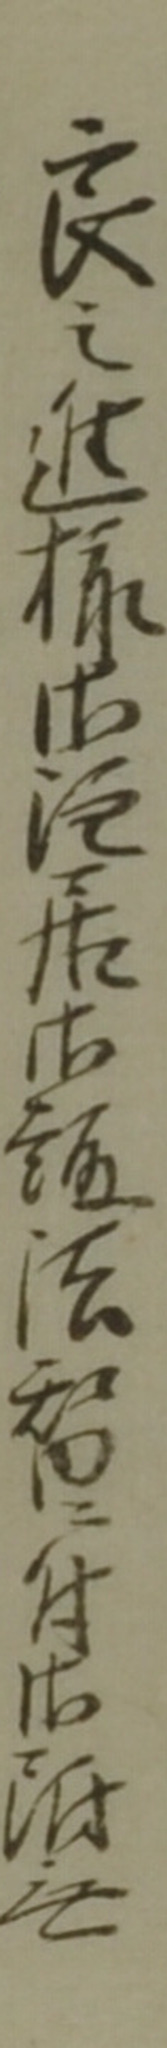良之進様御隠居御趣法替ニ付御附無
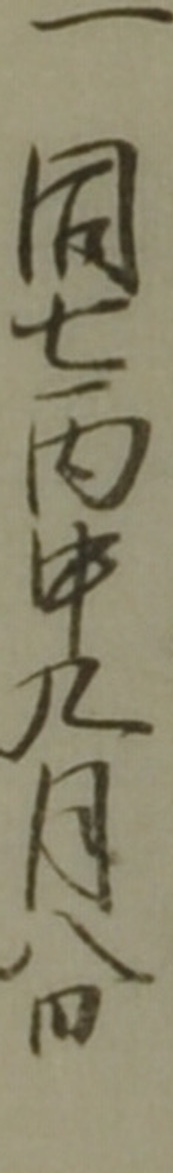一同七丙申九月八日
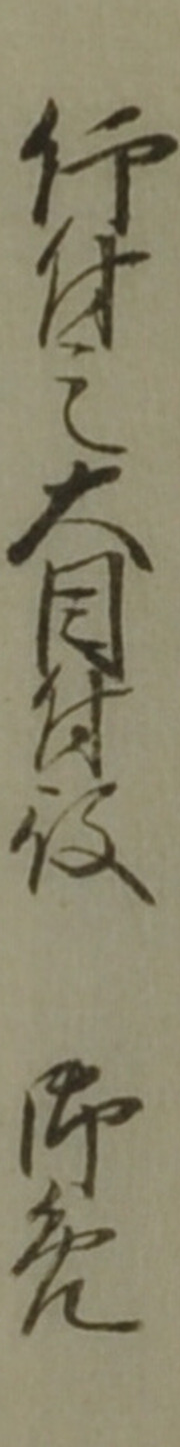仰付之大目付被御免
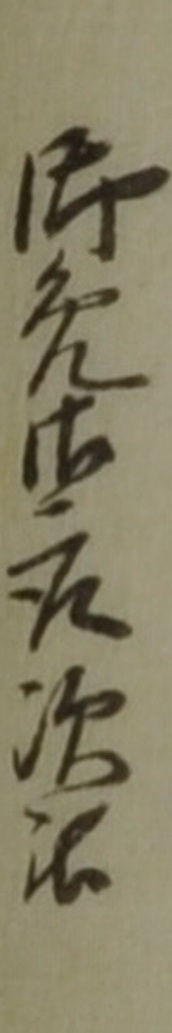滞御免御取次被
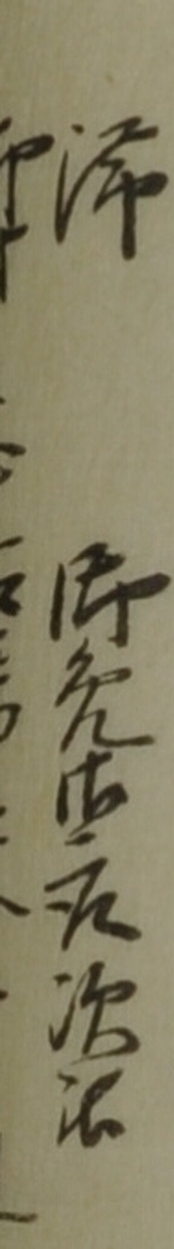滞御免御取次被
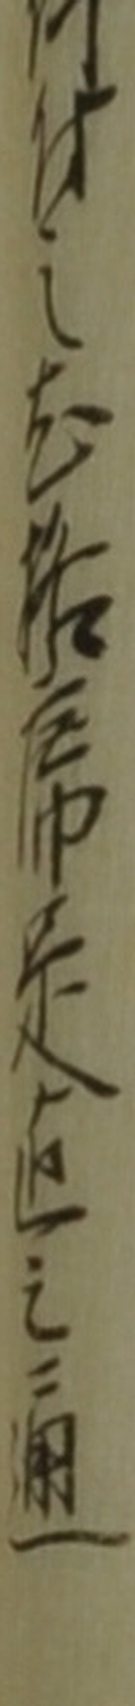仰付之尤格席是迄之通
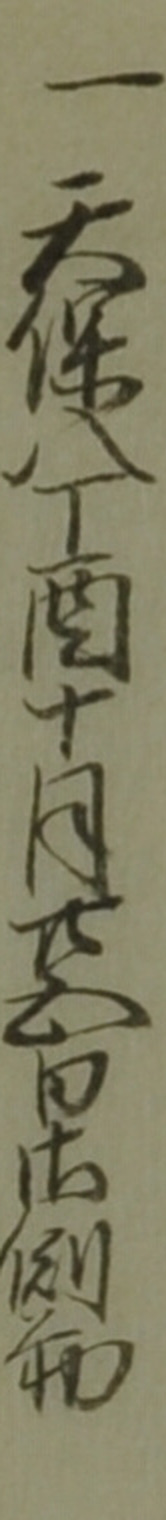一天保八丁酉十月廿五日御側勤
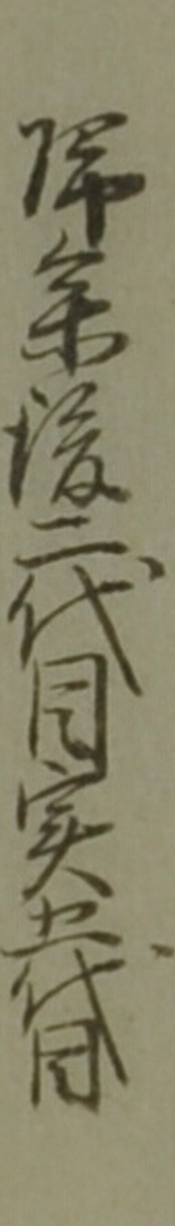帰参後二代目実五代目
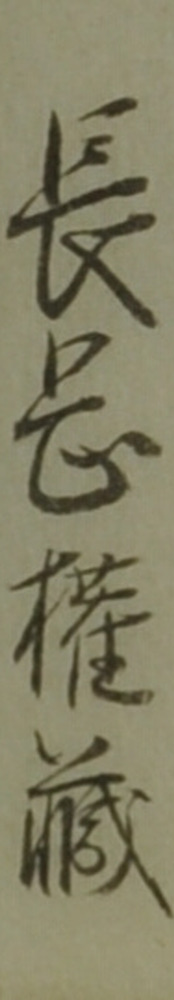長岡権蔵
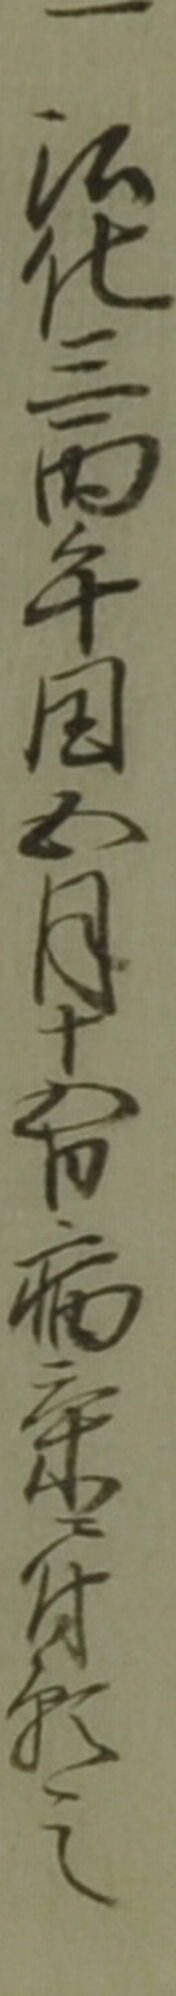一弘化三丙午閏五月十五日病気ニ付願之
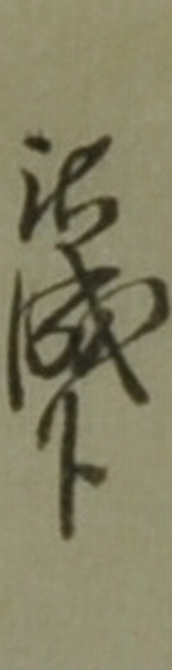被成下
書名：諸御役代々録（六）
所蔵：伊那市立高遠町図書館・合同会社AMANE
